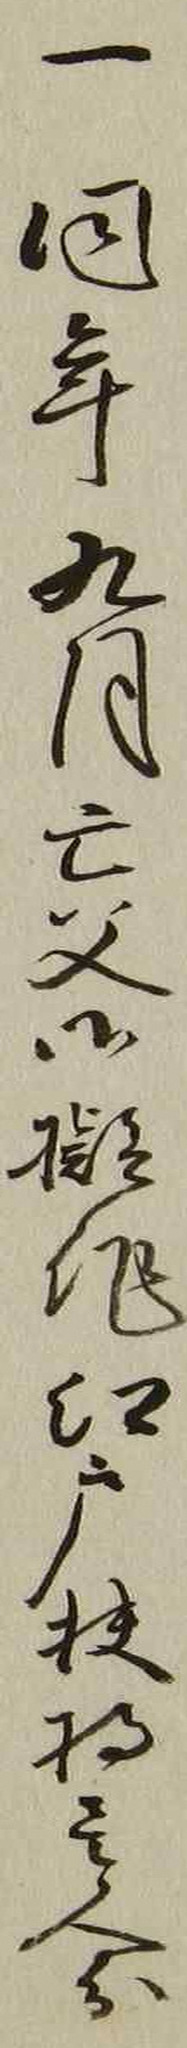一同年九月亡父御擬作江戸扶持壱人分
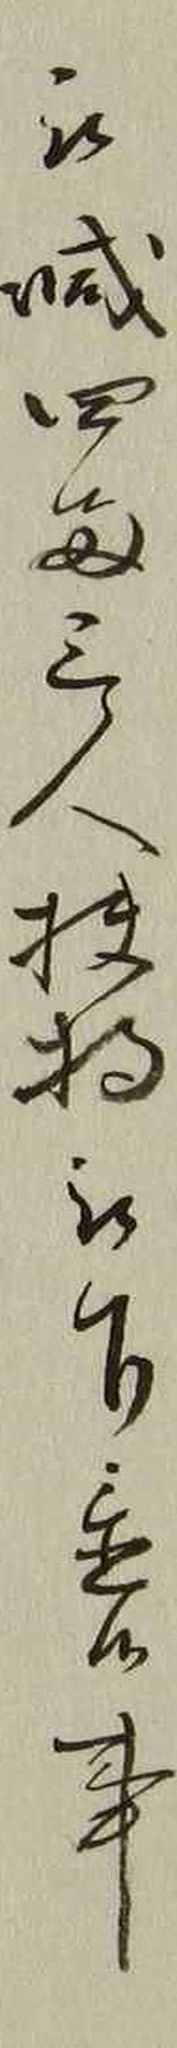被減四両三人扶持被下置候事
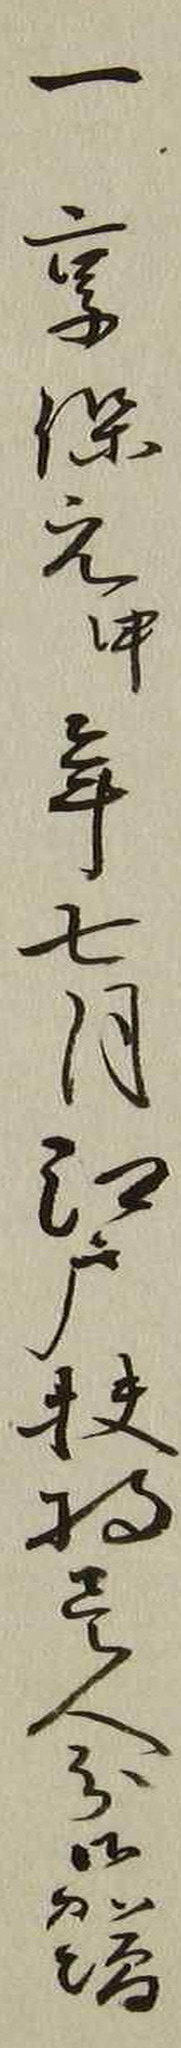一享保元申年七月江戸扶持壱人分御加増
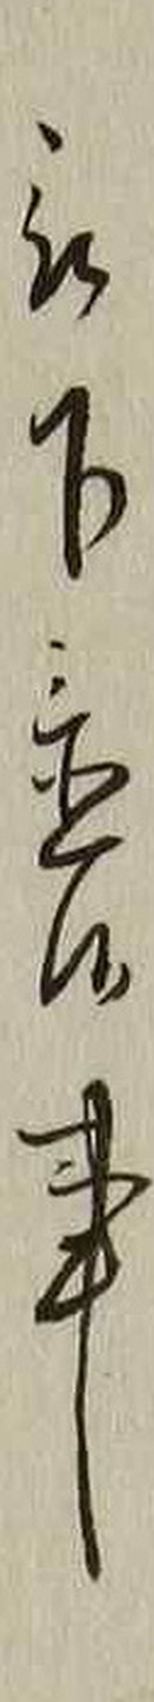被下置候事
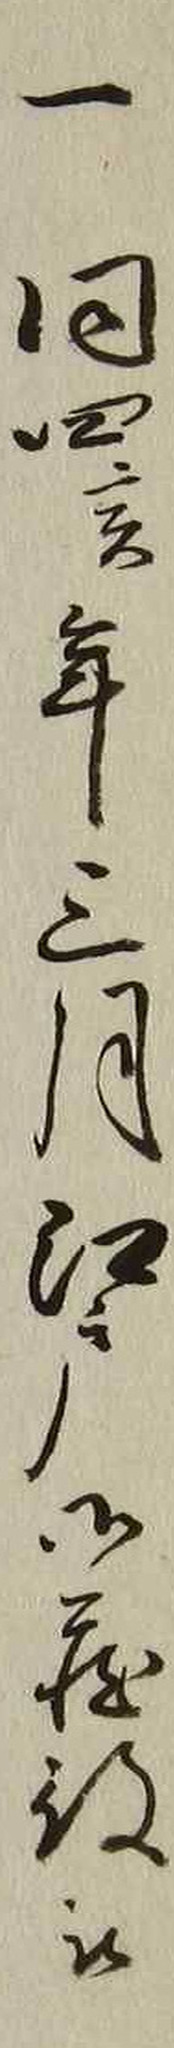一同四亥年三月江戸御蔵役被
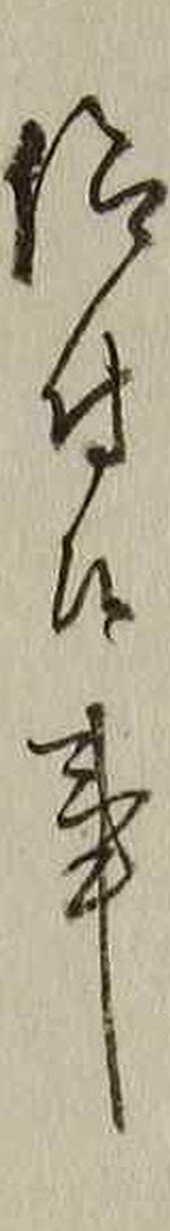仰付候事
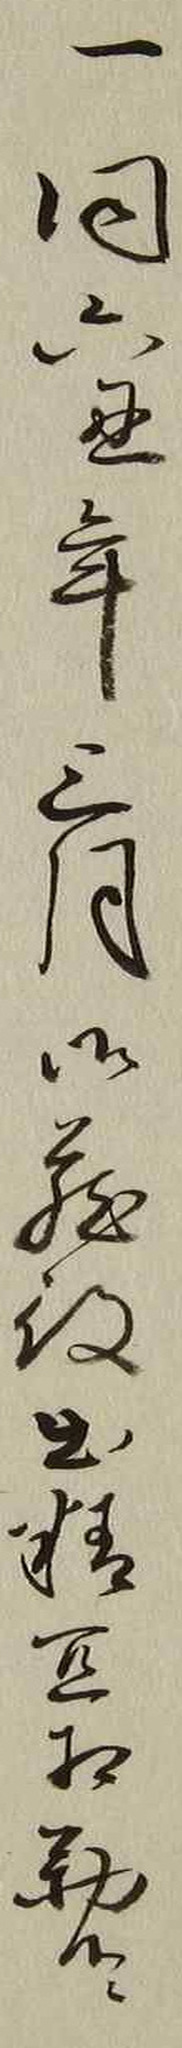一同六丑年三月御蔵役出精宜相勤候ニ
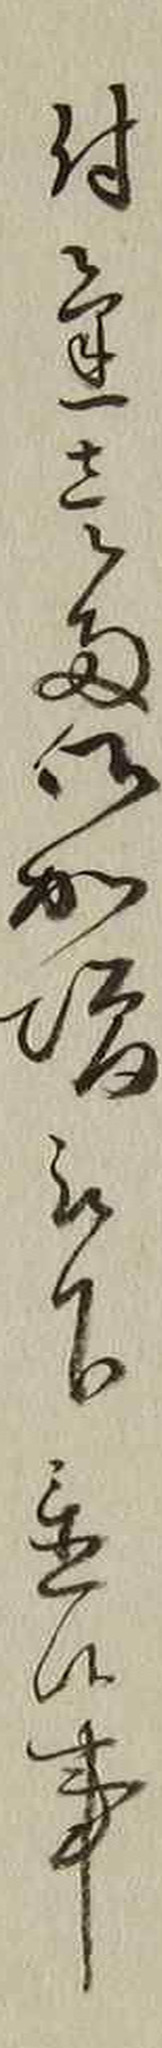付金壱両御加増被下置候事
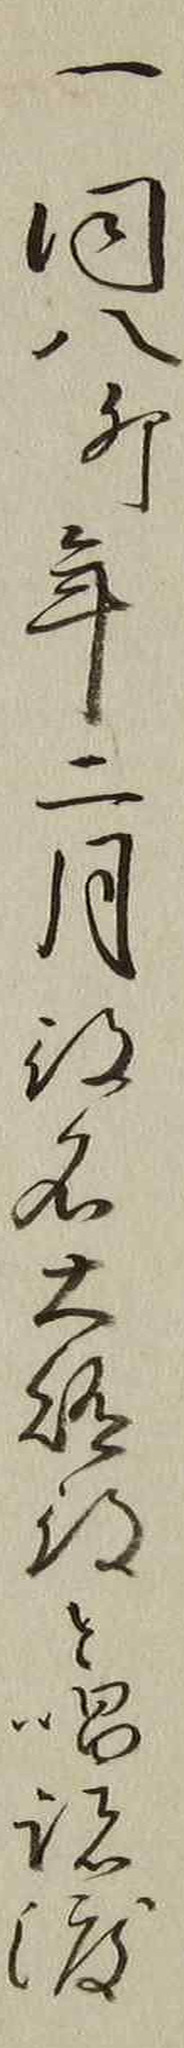一同八卯年二月役名大賄役と唱諸渡
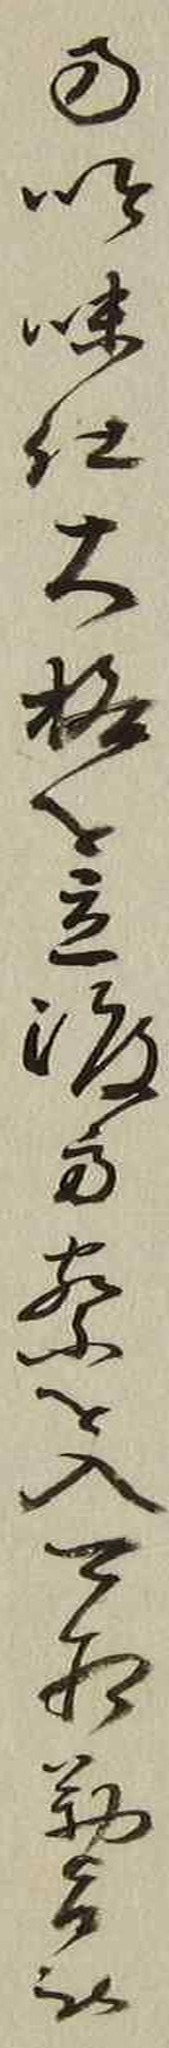方吟味仕大格を立渡方察を入可相勤旨被
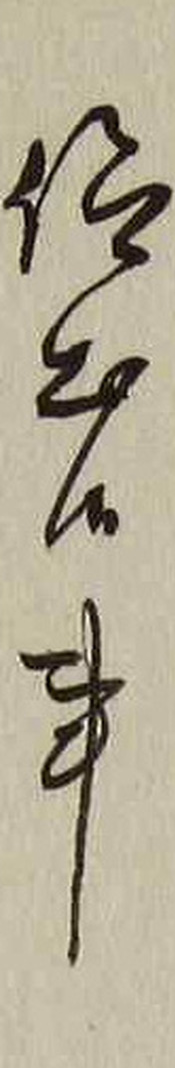仰出候事
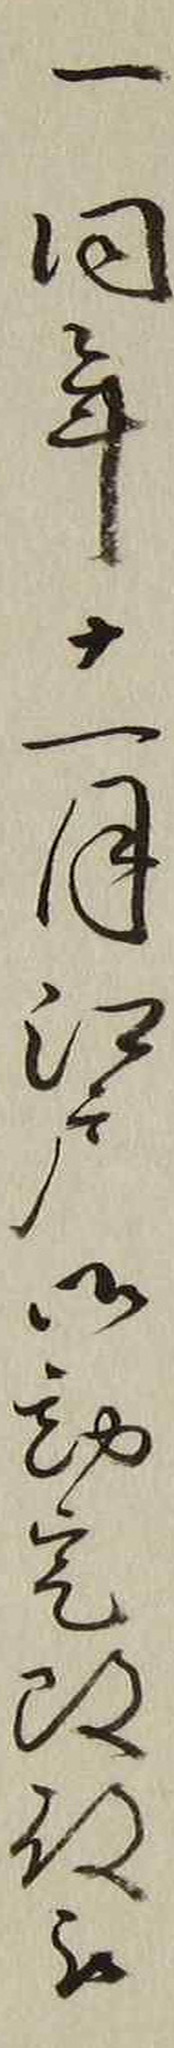一同年十一月江戸御勘定改役被
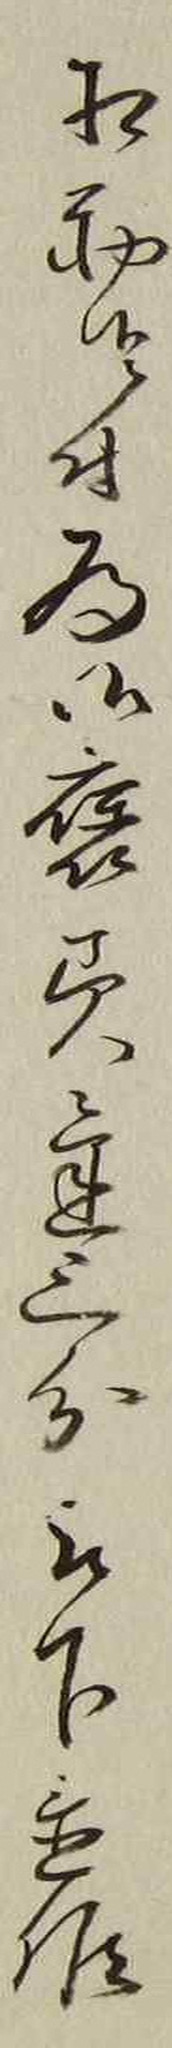相勤候ニ付為御褒美金三分被下置候
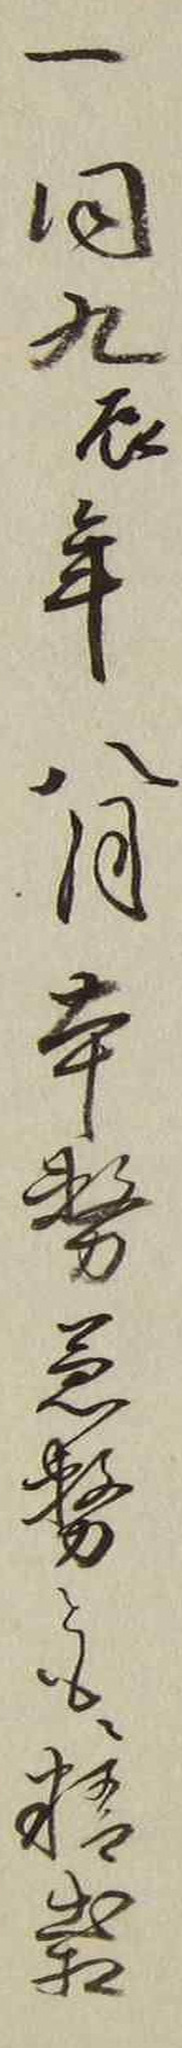一同九辰年八月本務兼務ともニ精出相

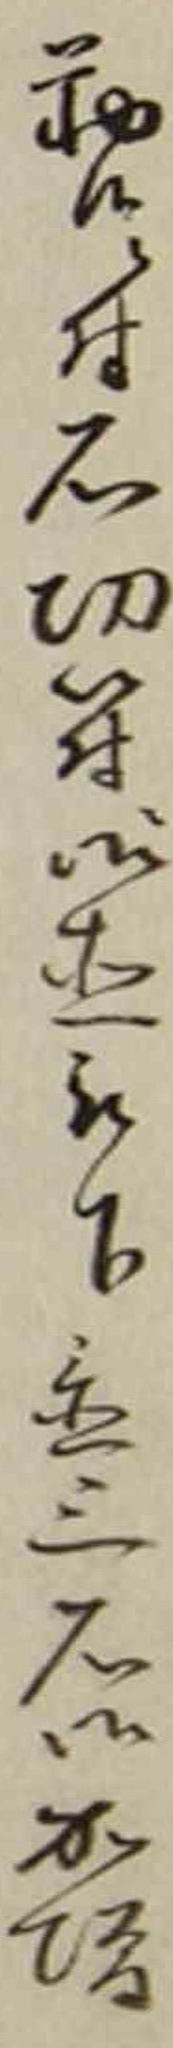勤候ニ付石切符ニ御直被下置三石御加増
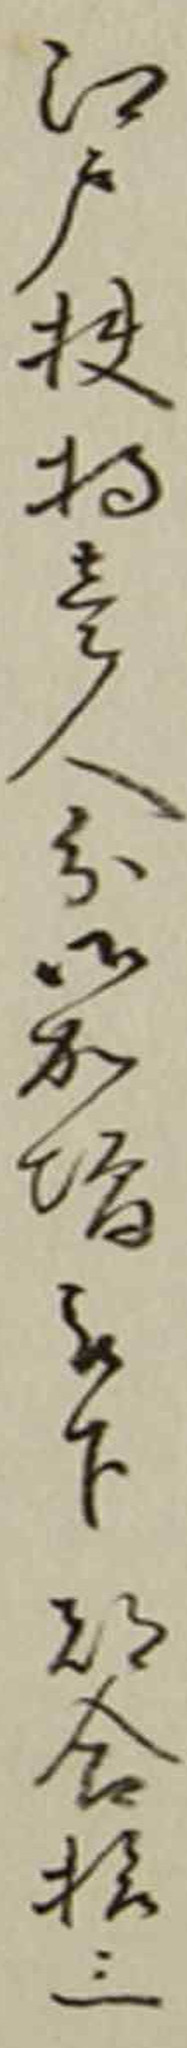江戸扶持壱人分御加増被下都合拾三
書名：諸士系譜　巻之4　い之部4
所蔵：会津若松市立会津図書館
